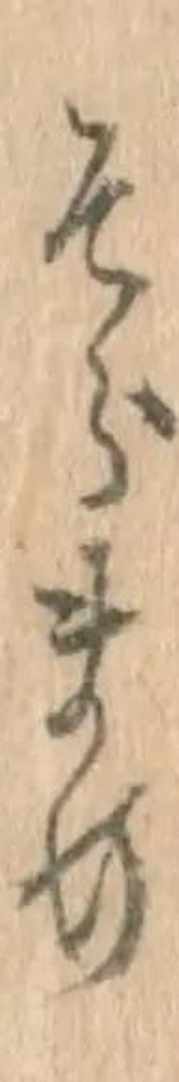そらまめ
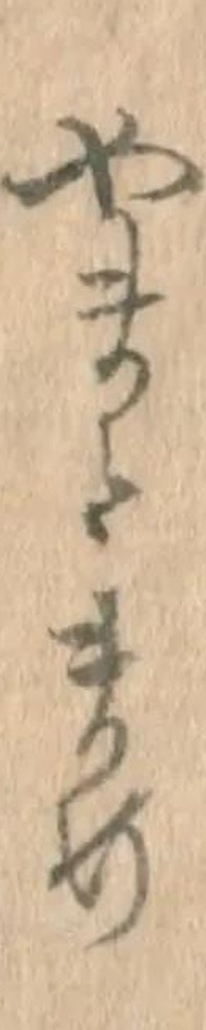やまとまめ
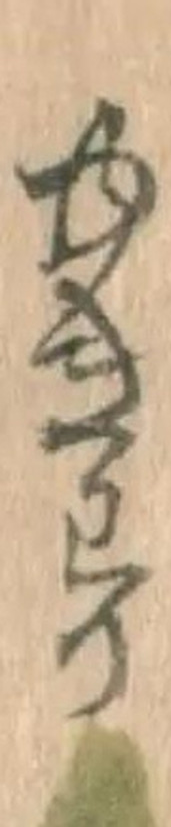ゆきわり
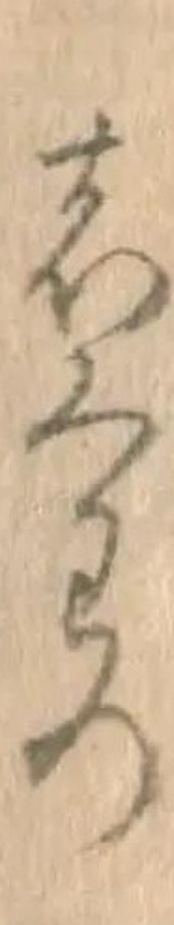しくわつ
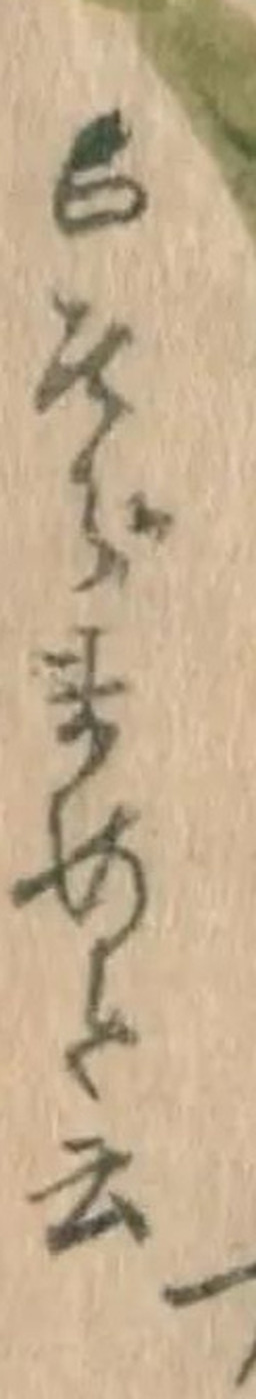●○そらまめと云
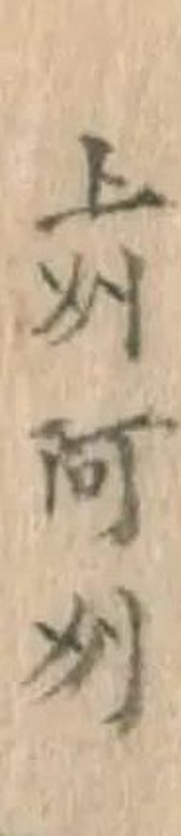上州阿州
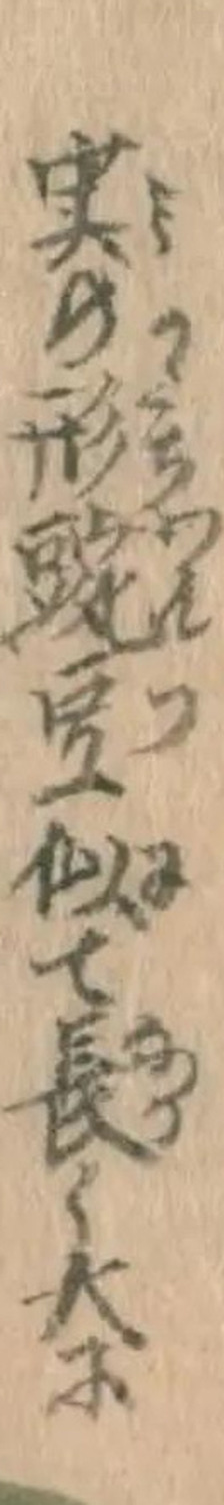実の形豌豆似て長く大に
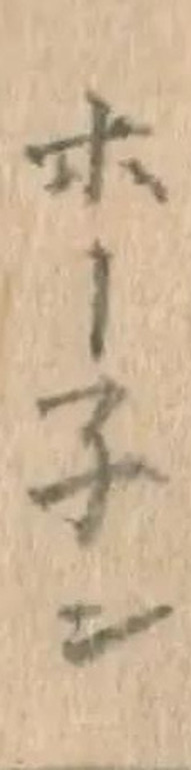ホーネン
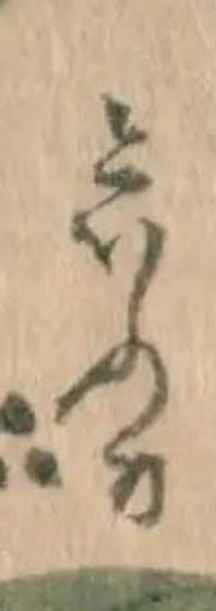といふは
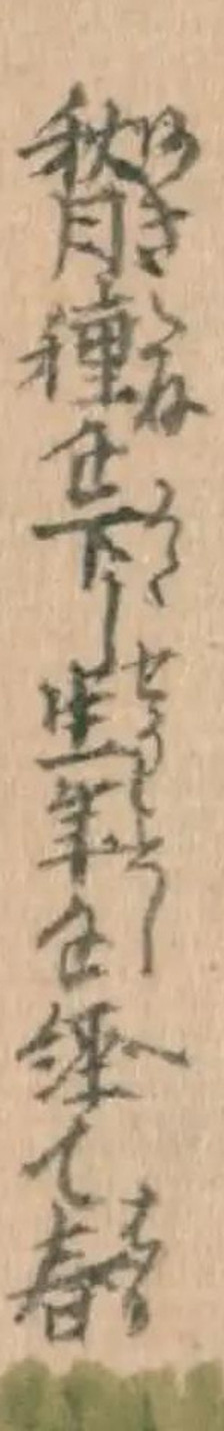秋月種を下し生年を経て春
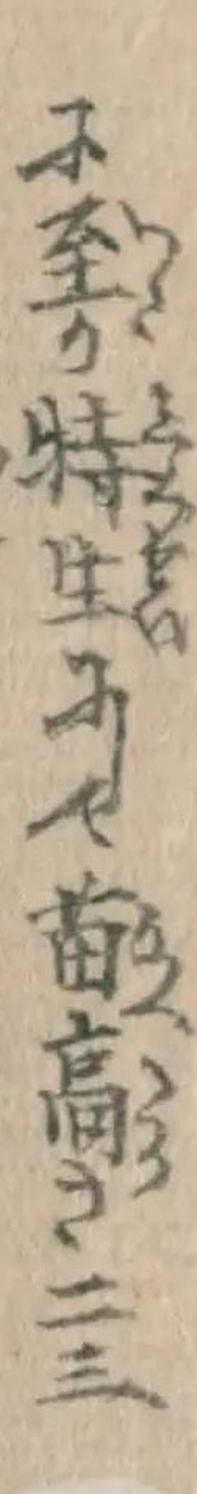に至り特生にして苗高さ二三
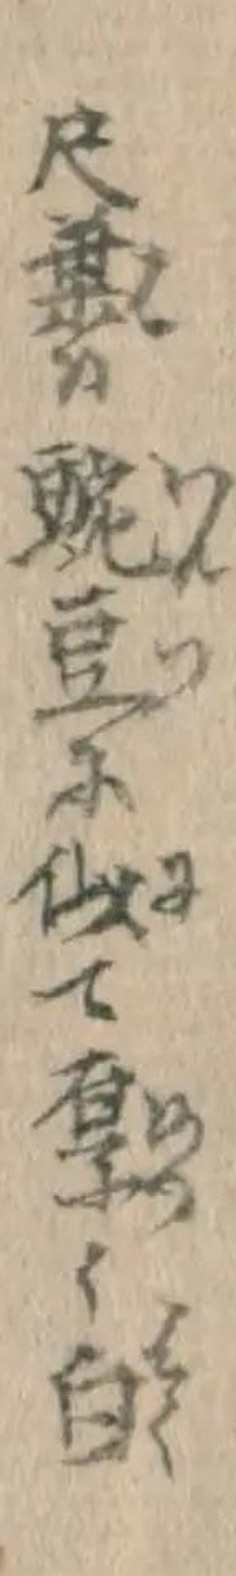尺葉は豌豆に似て厚く白
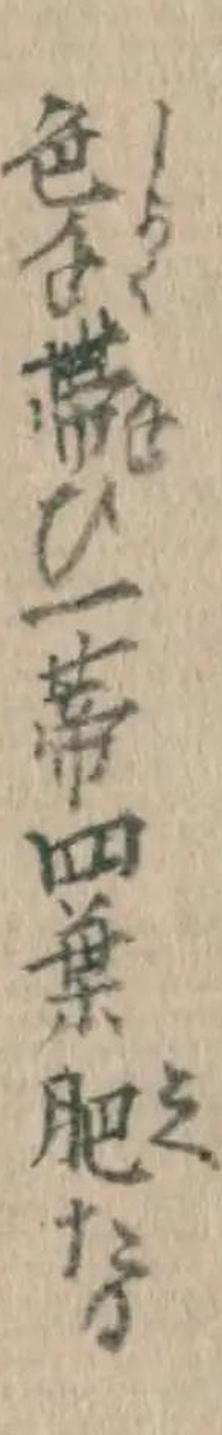色を帯ひ一蒂四葉肥たる
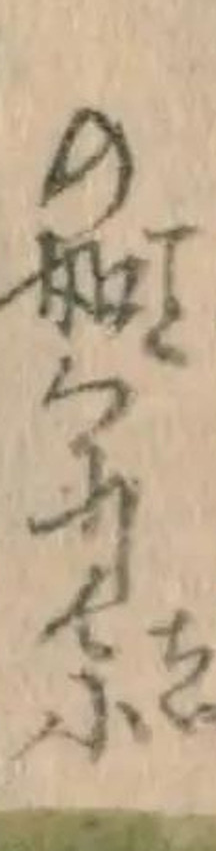の如くにして小
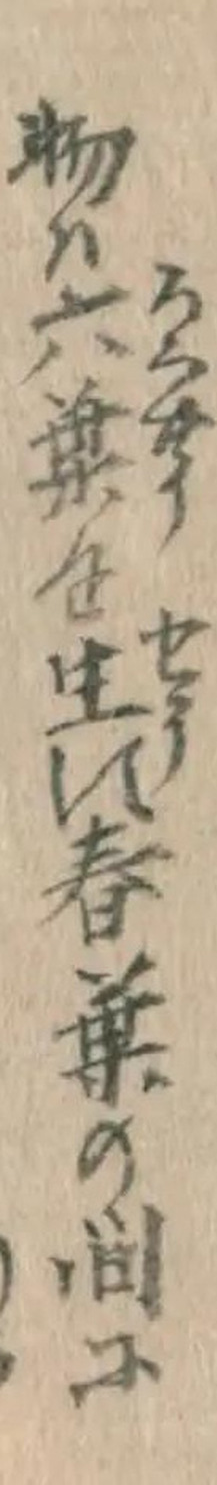物は六葉を生す春葉の間に
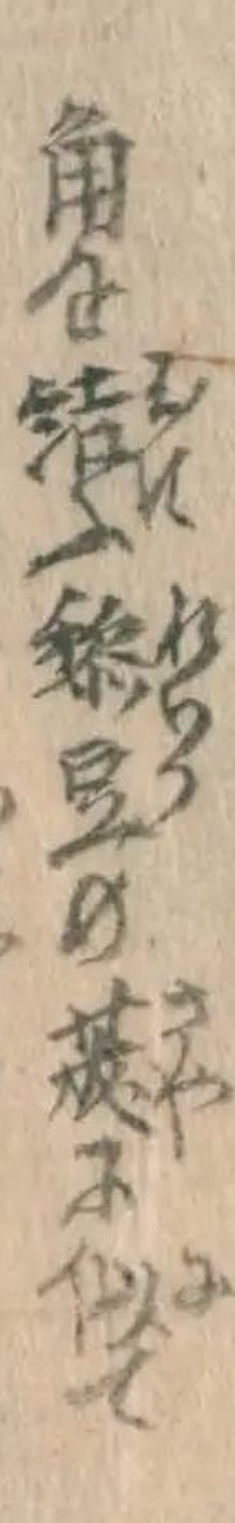角を結ふ黎豆の莢に似て
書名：本草図譜. 巻43-45
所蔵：国立国会図書館 National Diet Library, JAPAN
